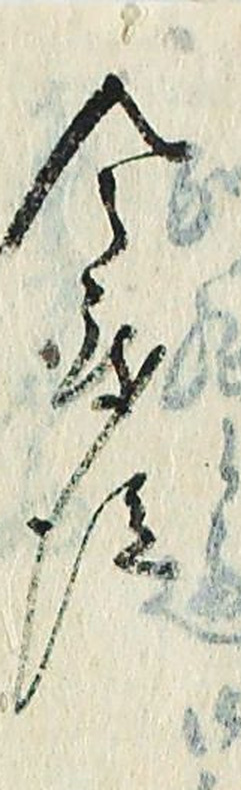今度従
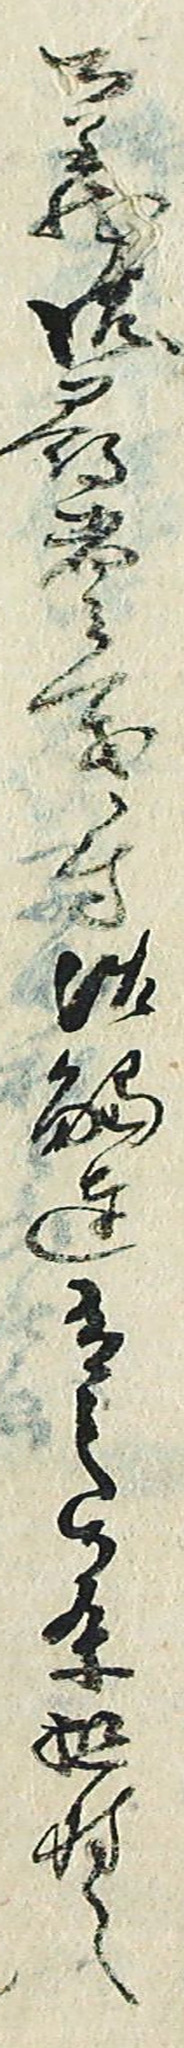公義御尋者之義に付御触達有之候条組村々
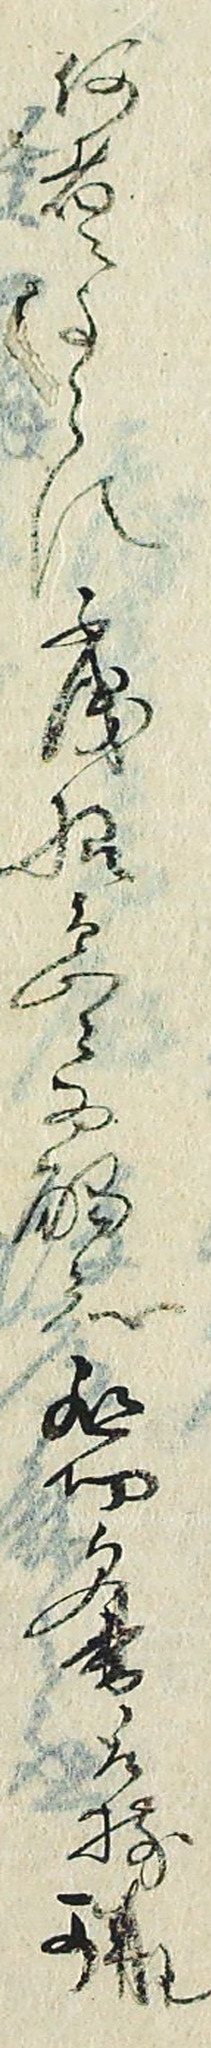何者によらす不洩様急々為触知組切受書取揃可
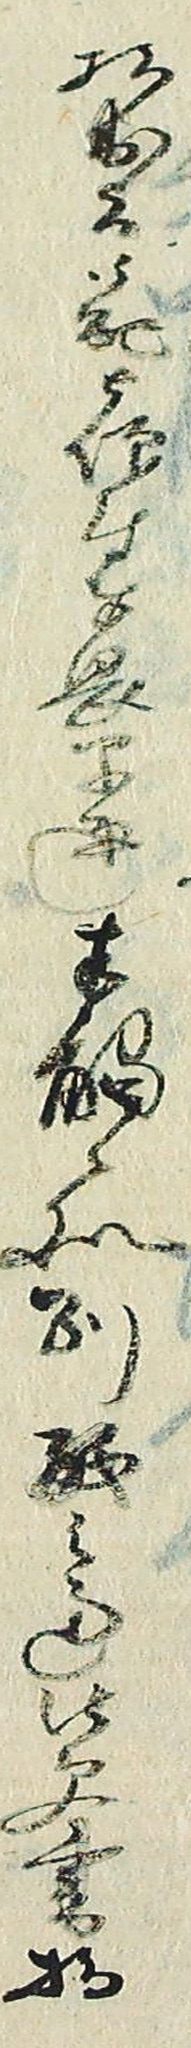指出旨御触被仰付奉畏早速相触候処別紙之通御受書指
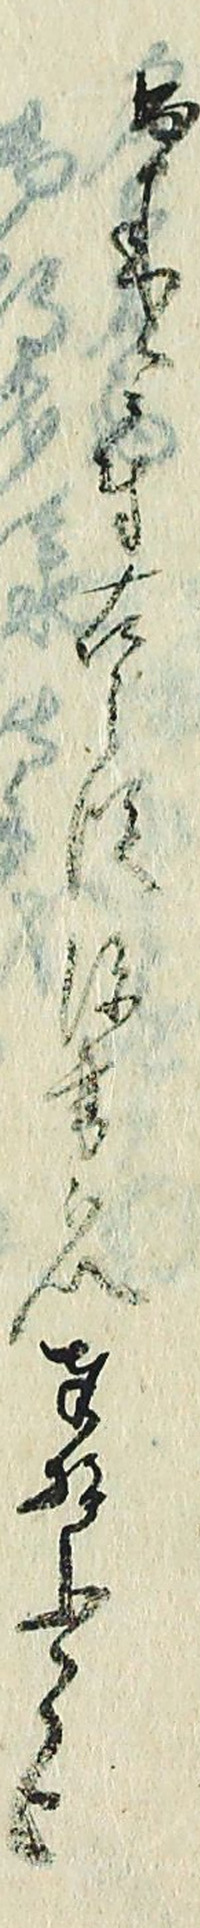出来候に付右之段添書を以奉指上候以上
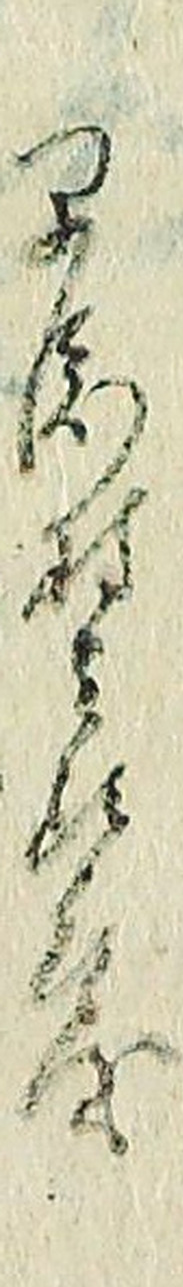早渕村与頭庄屋
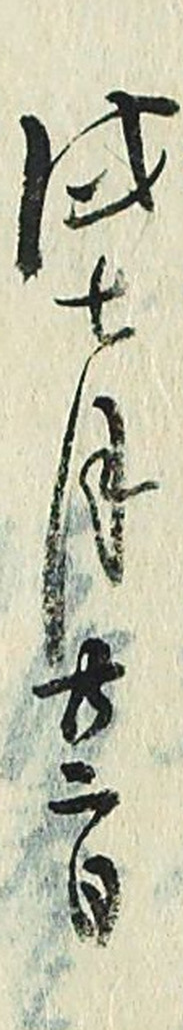戌七月廿二日
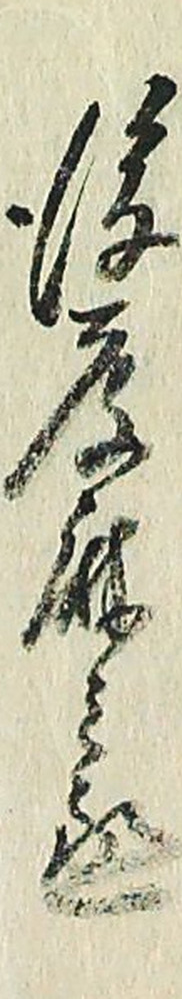後藤麻之丞
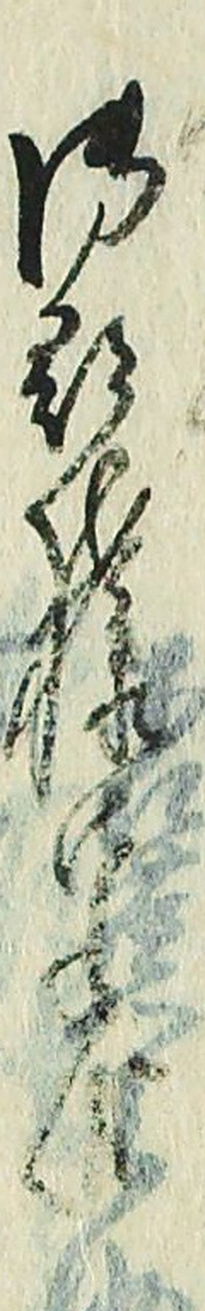御郡代様御手代
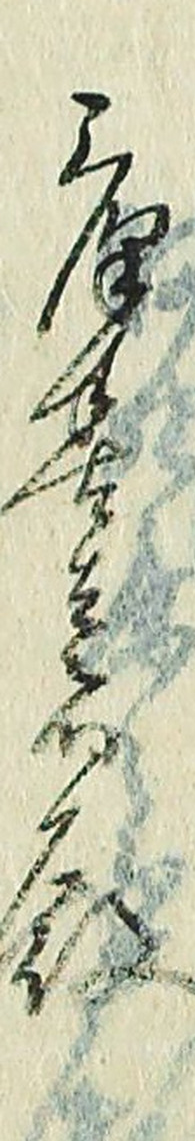三沢春太郎殿
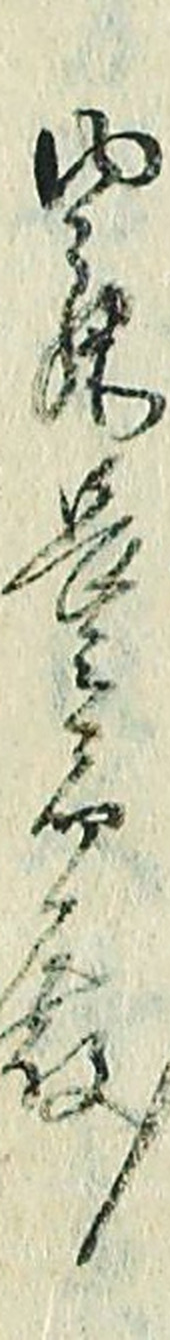内藤長三郎殿
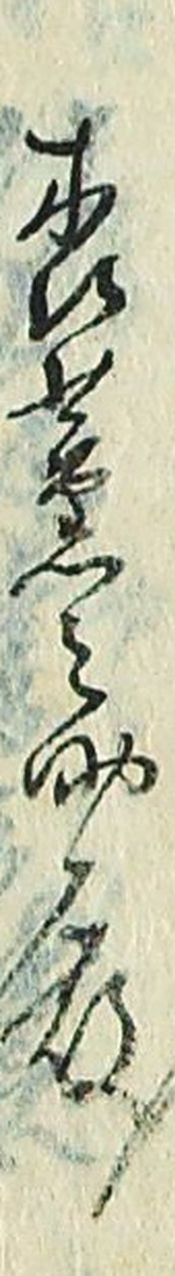森薫之助殿
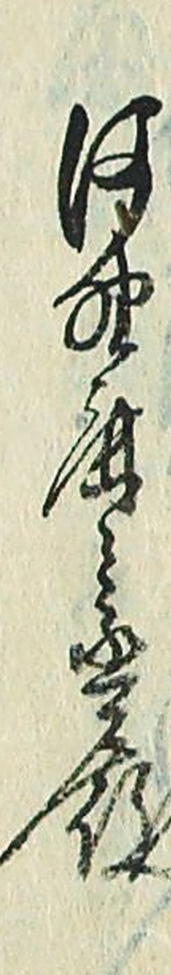河野鹿之丞殿
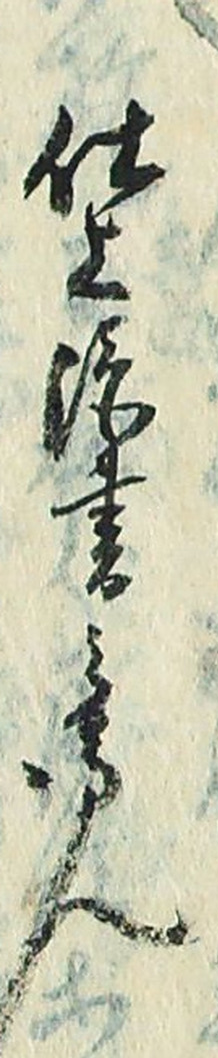仕上添書之覚
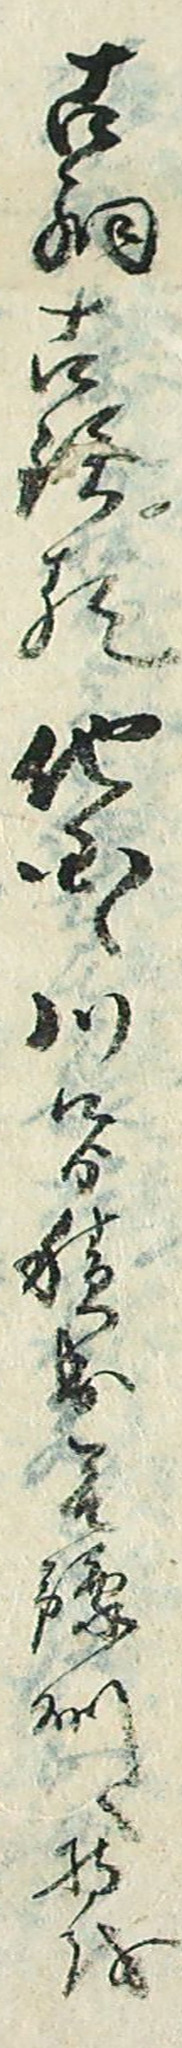古銅古銀類他国へ川口ゟ積出幷豫州へ持越
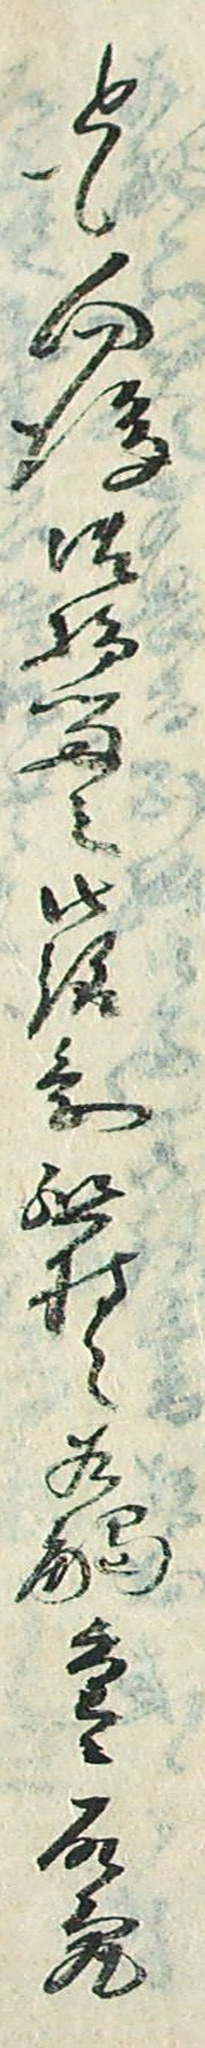とも向後御指留之御趣意組村々相触重々取究
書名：諸御用御□受書控
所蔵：鳴門教育大学 Naruto University of Education
